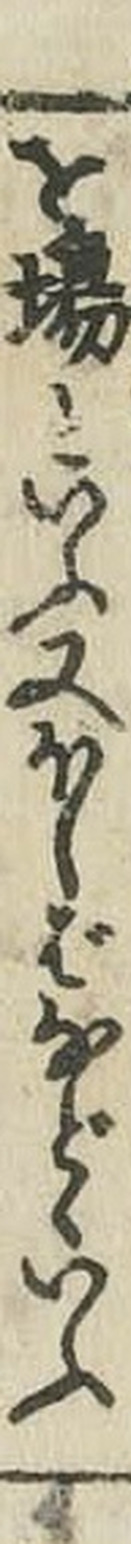を場といふ又ほしばなどゝいふ
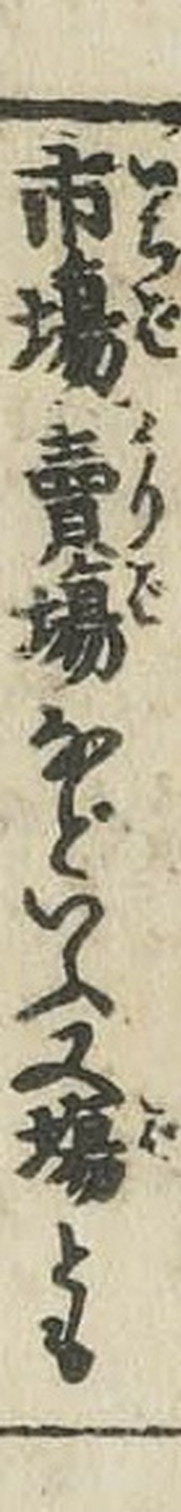市場売場などいふ又場とも
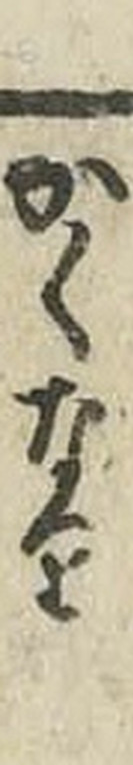かくなり
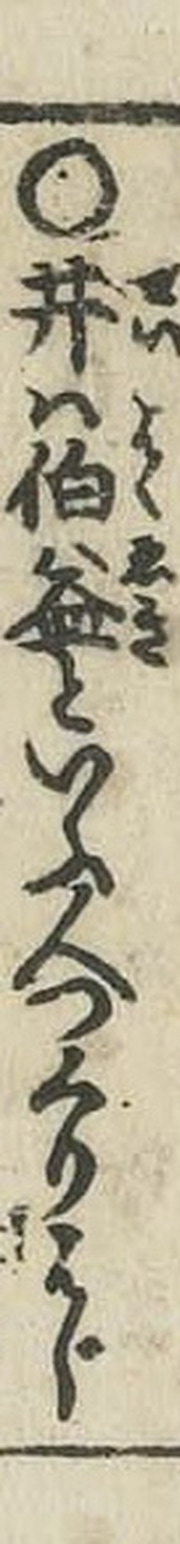○井は伯益といふ人つくりはじ
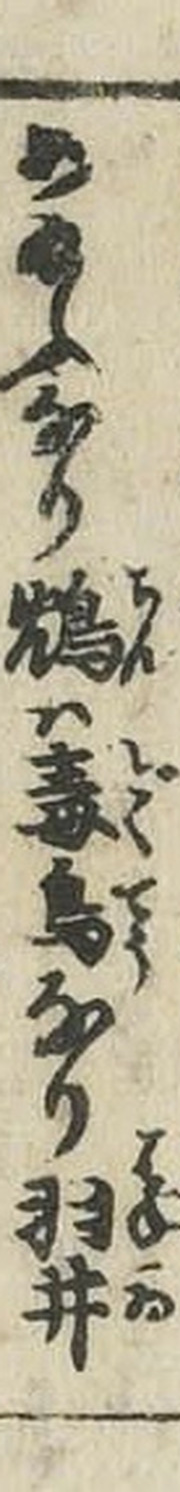め給ふなり鴆は毒鳥なり羽井
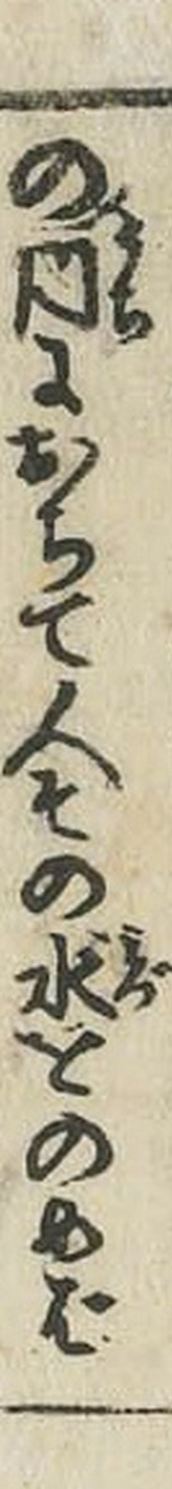の内におちて人その水をのめば
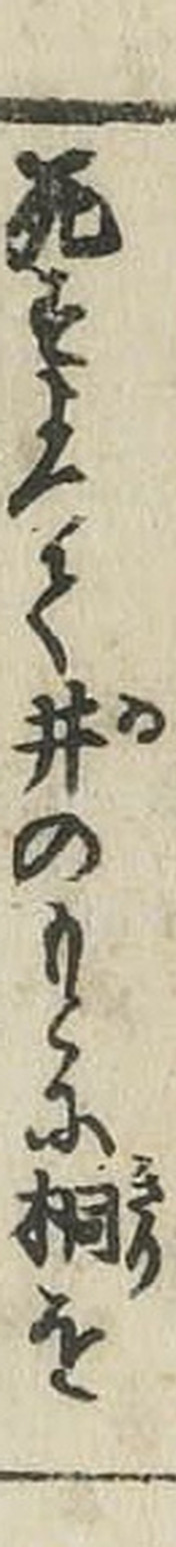死すよつて井のもとに桐を
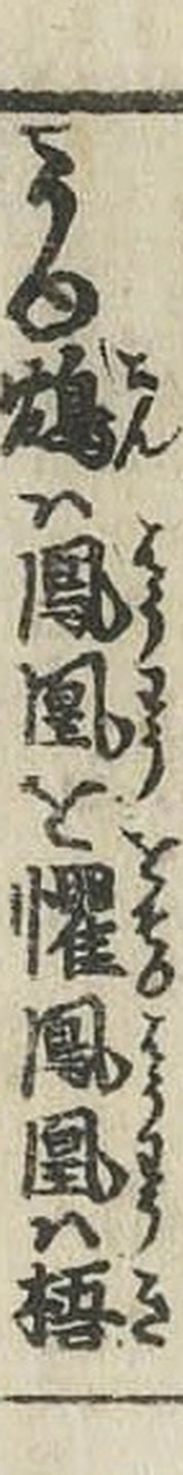うゆ鴆は鳳凰を懼鳳凰は梧
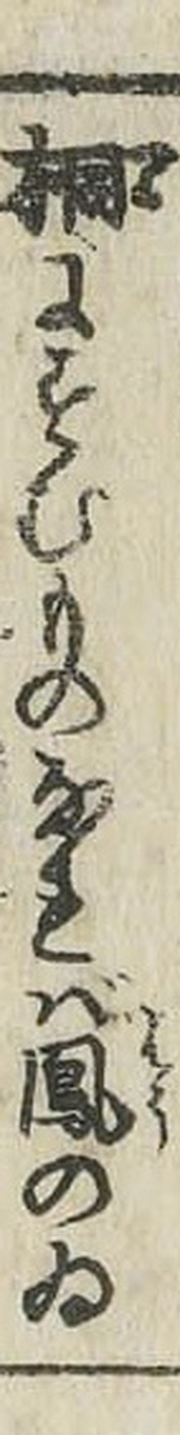桐にすむものなれば鳳のゐ
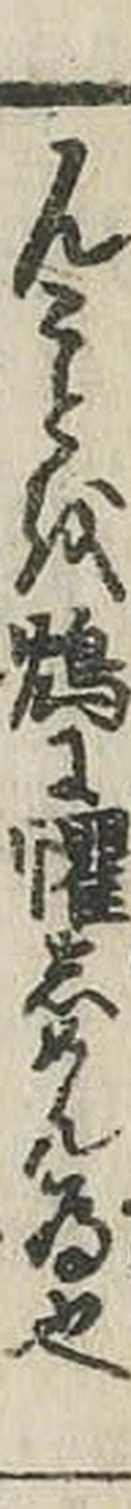んことを鴆に懼しめん為也
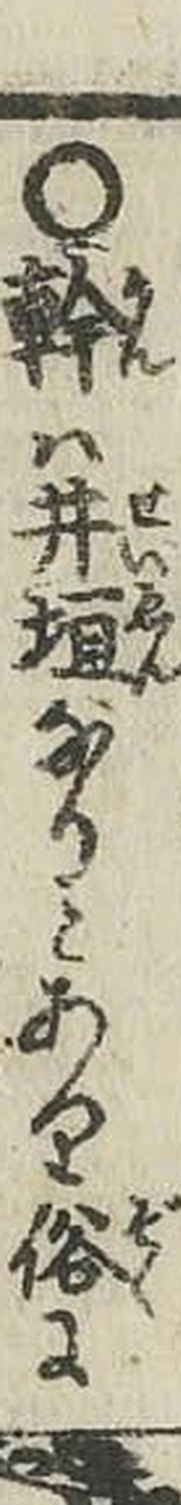○幹は井垣なりとあり俗に
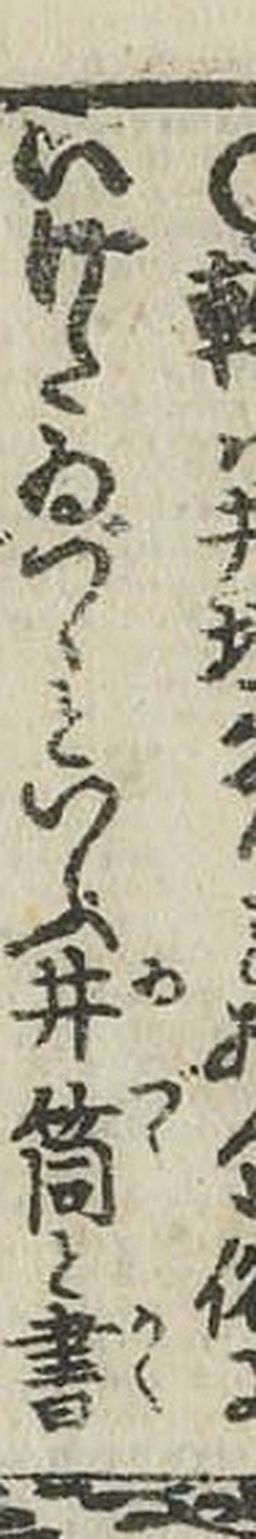いけたゐづゝといふ井筒と書
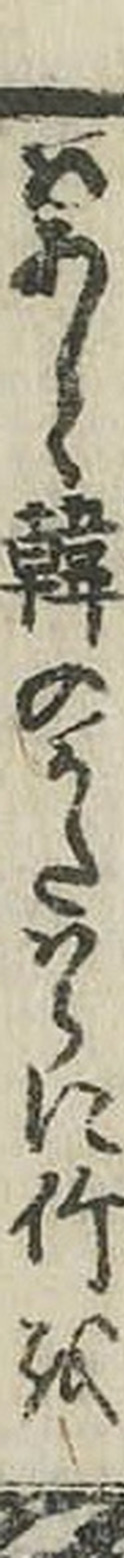はあしく韓のかたはらに竹を
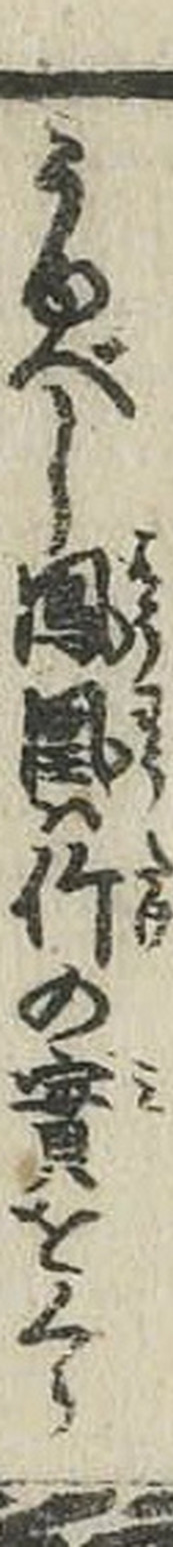うゆべし鳳凰は竹の実をくら

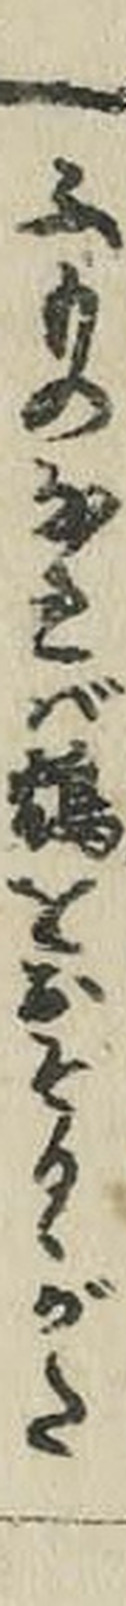ふものなれば鴆をおそるゝがた
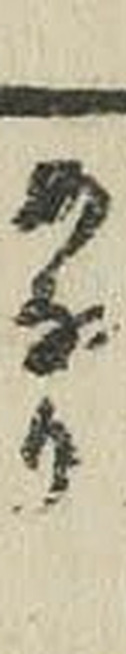めなり
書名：増補頭書訓蒙図彙大成 10巻 2:巻之1-3
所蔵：東京学芸大学教育コンテンツアーカイブ
